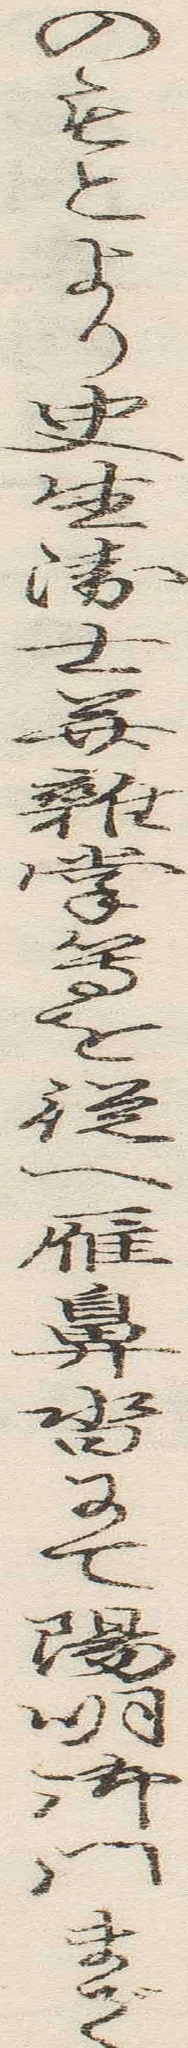のもとより史生衛士并雜掌等を従へ雁鼻沓にて陽明御門まで
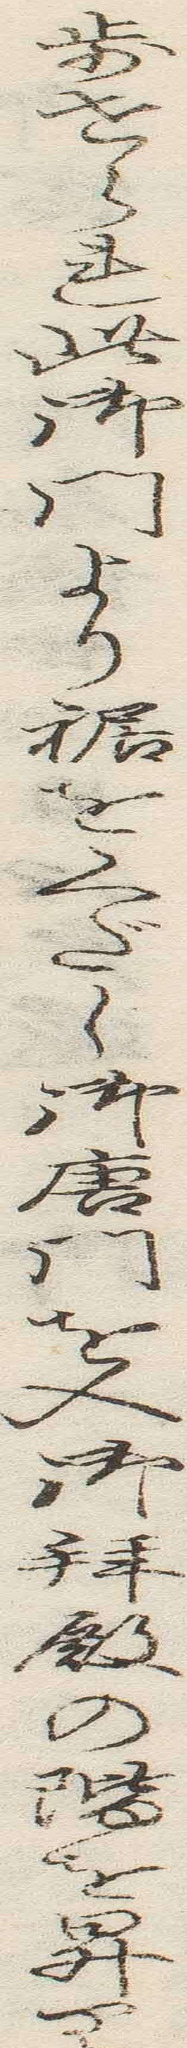歩せられ此御門より裾をくだし御唐門を入御拜殿の階を昇り
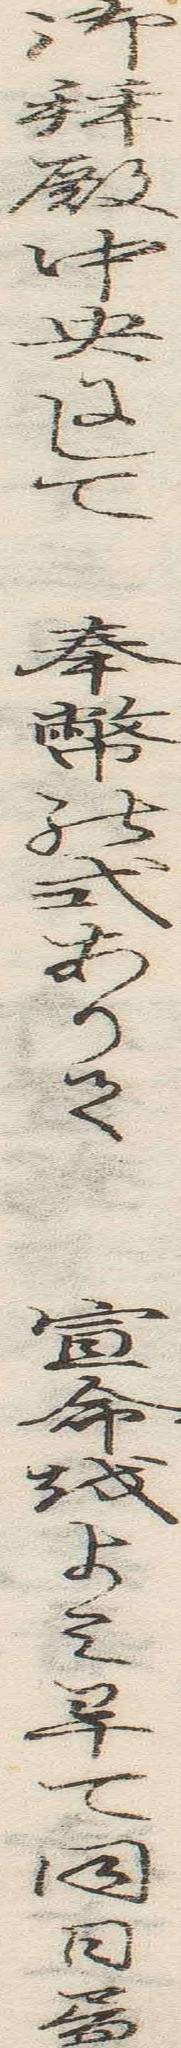御拜殿中央にして奉幣の式ありて宣命をよみ畢て同日昼
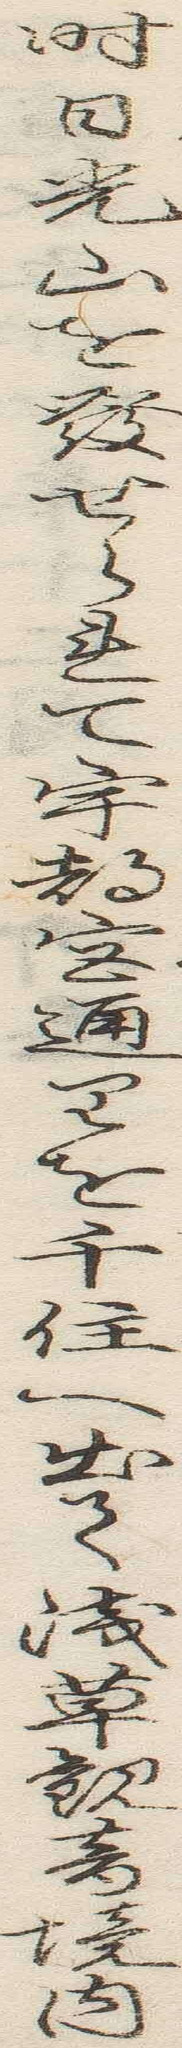时日光山を發せられて宇都宮通りを千住へ出て浅草觀音境内
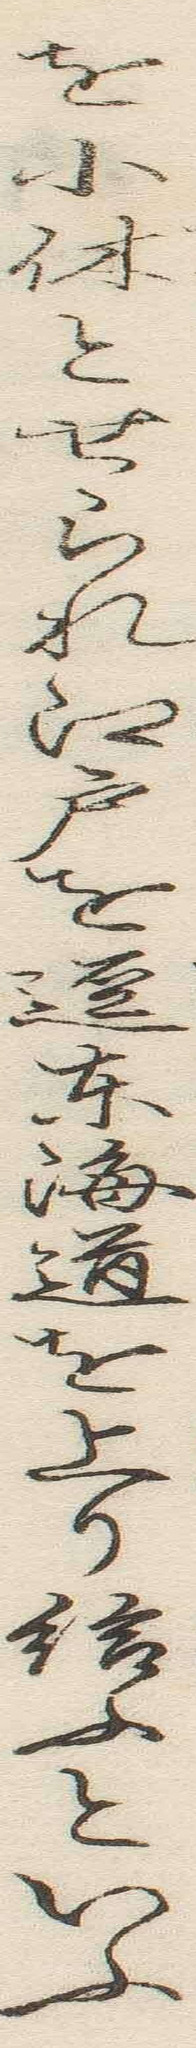を小休とせられ江戸を逕東海道を上り給ふといふ
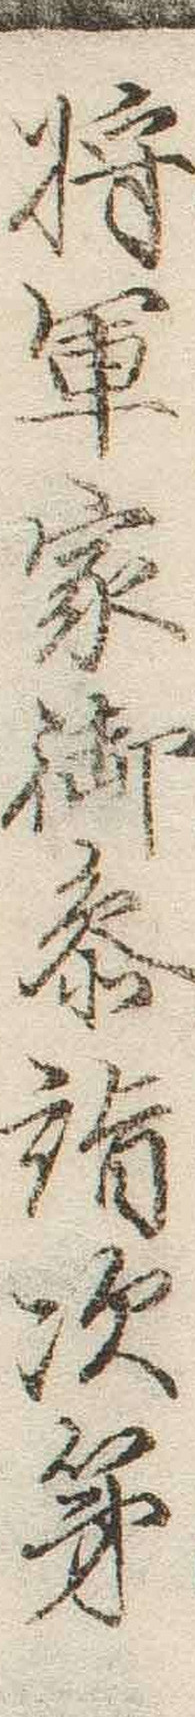将軍家御叅詣子第

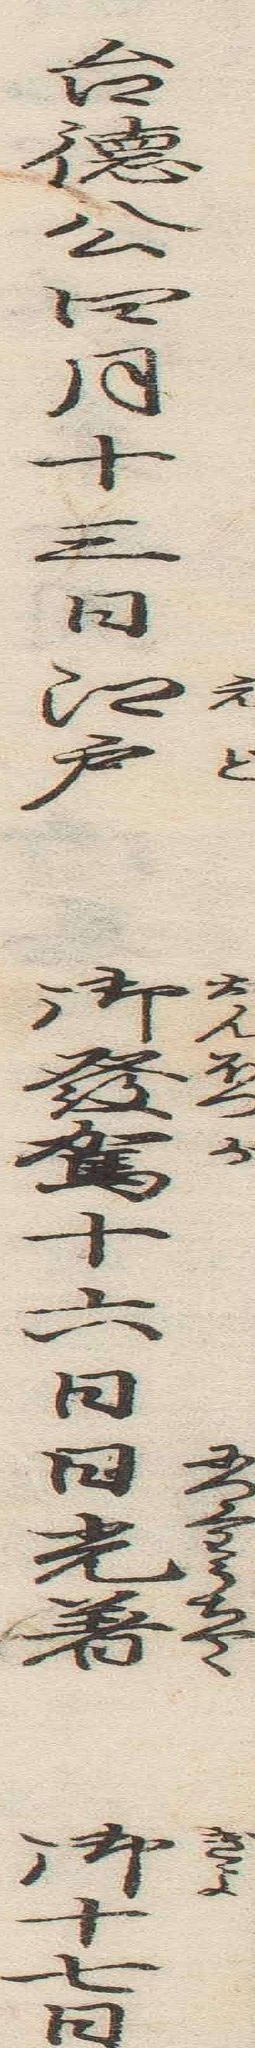台德公四月十三日江戸御發駕十六日日光着御十七日
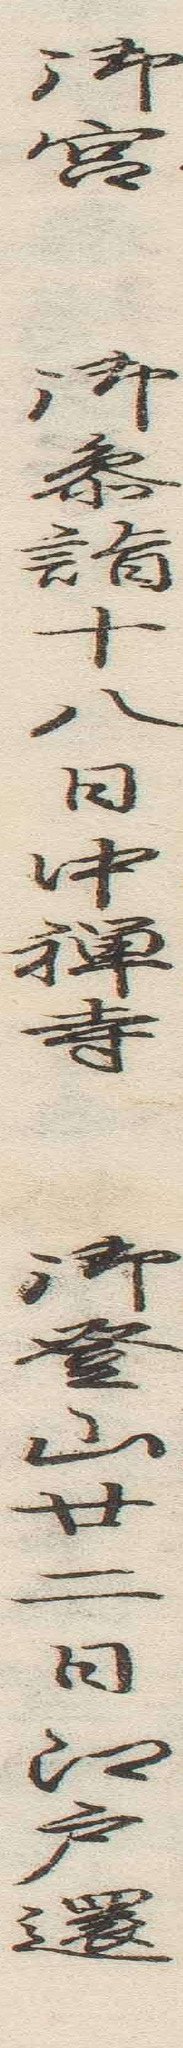御宮御叅詣十八日中禅寺御登山廿二日江戸還
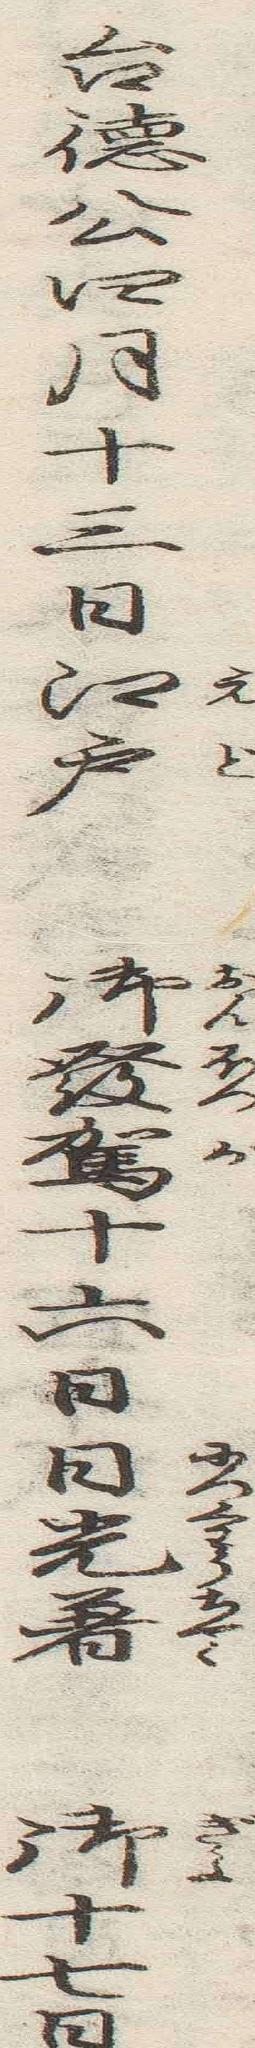台德公四月十三日江戸御發駕十六日日光着御十七日
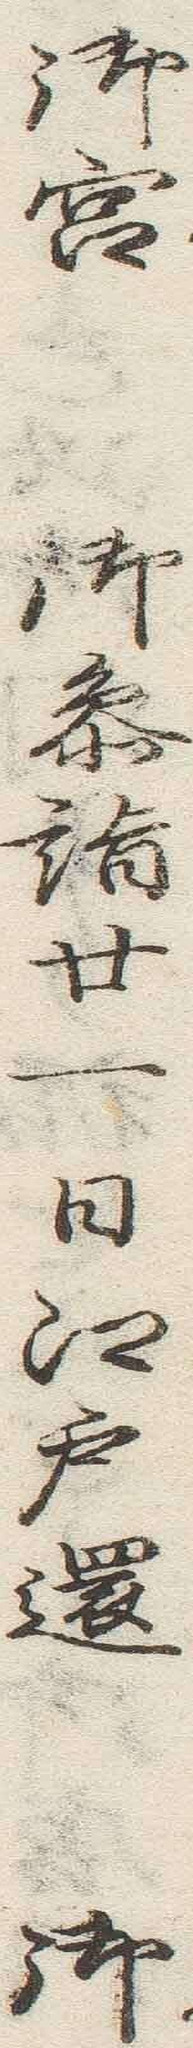御宮御叅詣廿一日江戸還御
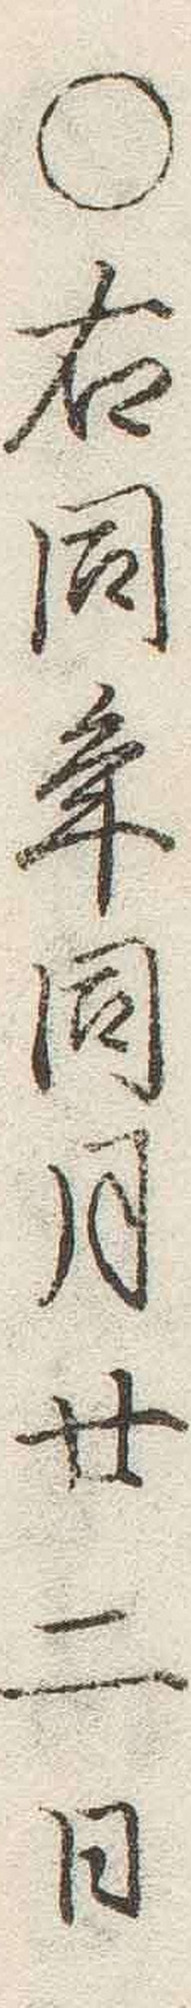○右同年同月廿二日
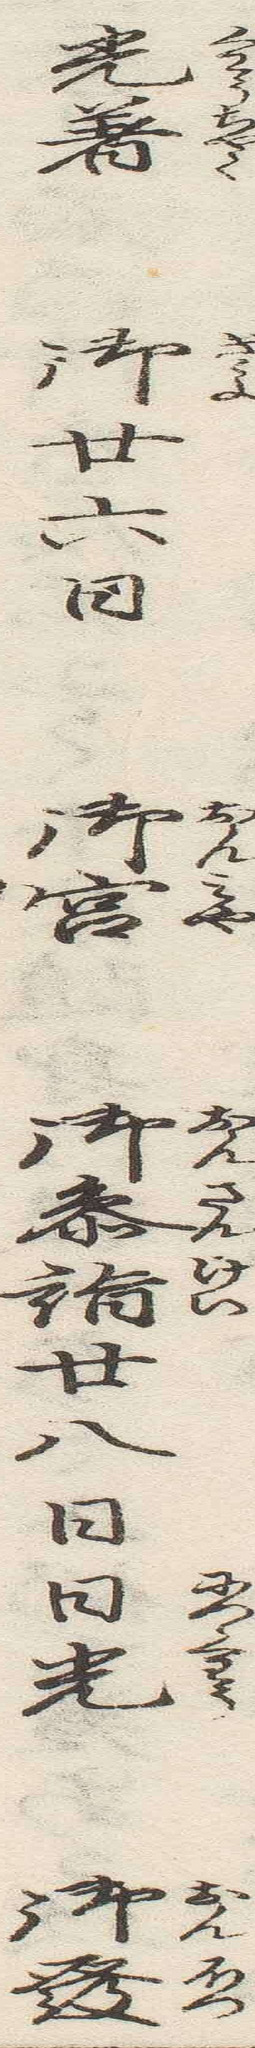光着御廿六日御宮御叅詣廿八日日光御發
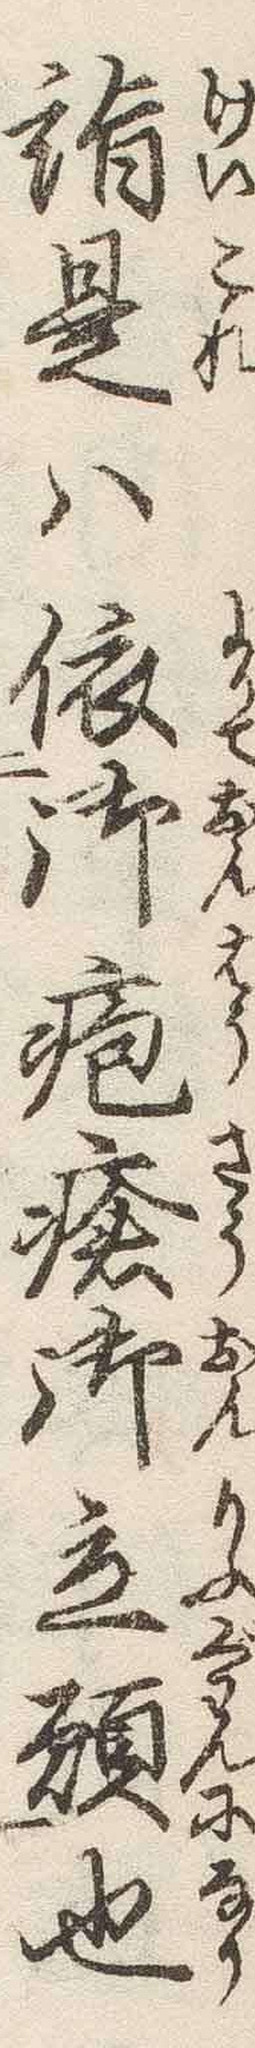詣是は依御疱瘡御立願也
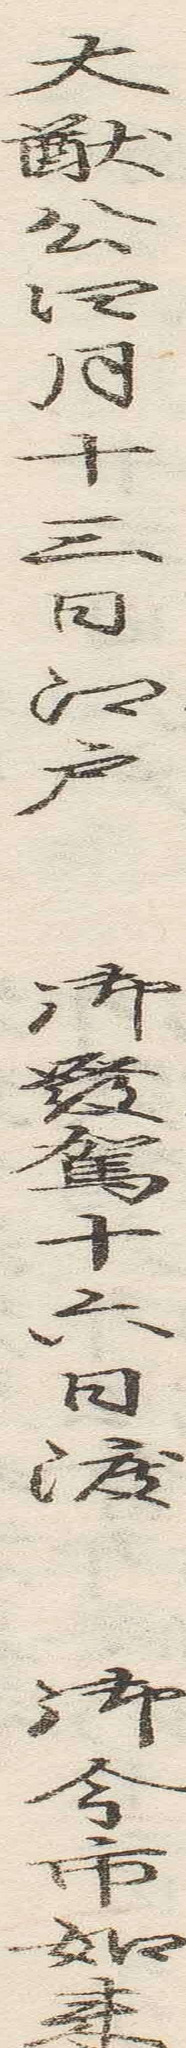大猷公四月十三日江戸御發駕十六日渡御今市如来
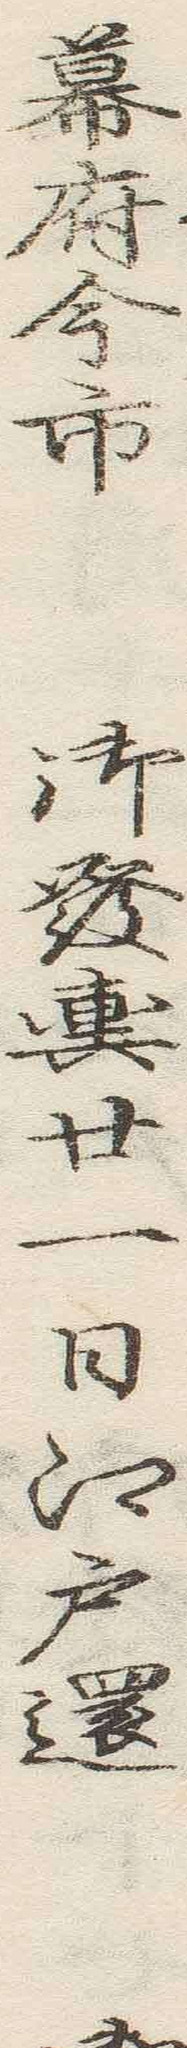幕府今市御發輿廿一日江戸還御
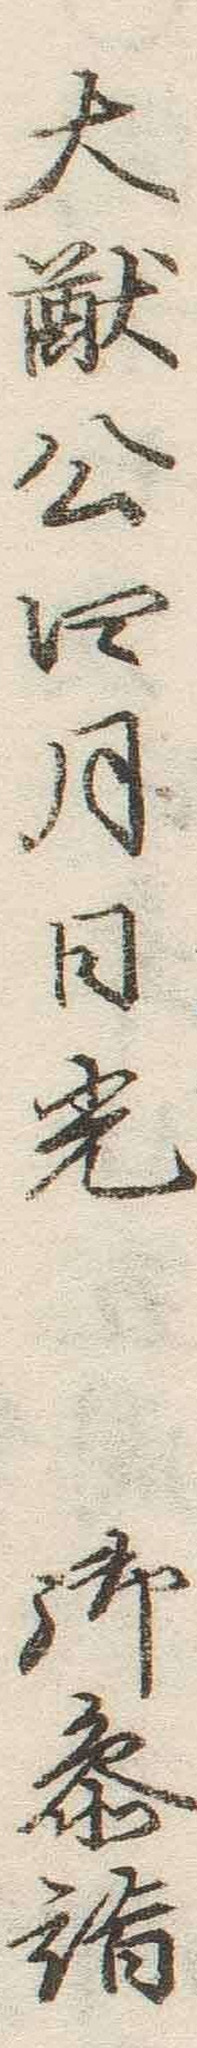大猷公四月日光御叅詣
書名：日光山志
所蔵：東京学芸大学附属図書館 国文学研究資料館
